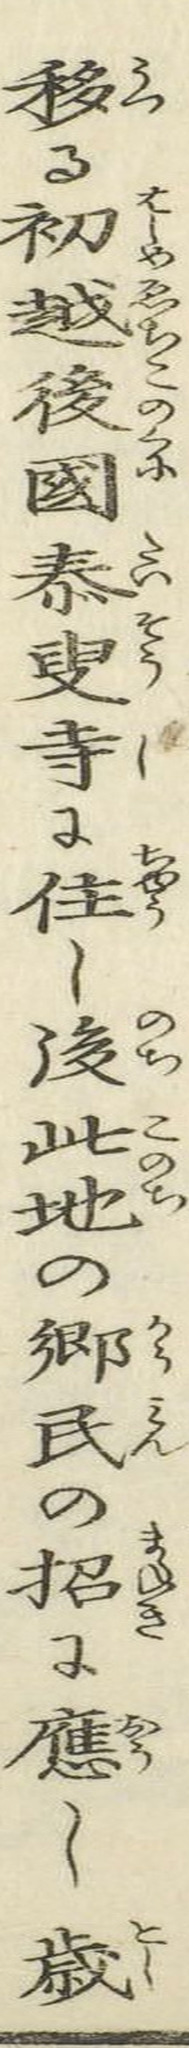移る初越後國泰叟寺に住し後此地の郷民の招に應し歳
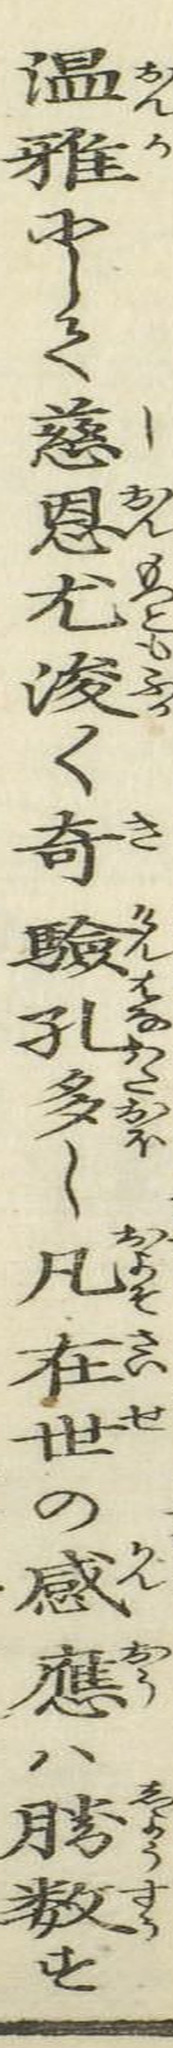温雅にして慈恩尤凌く奇驗孔多し凡在世の感應は勝数す
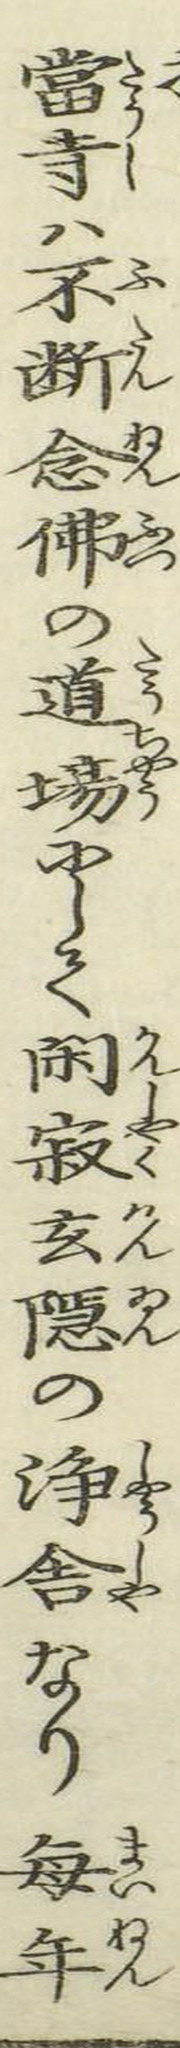當寺は不断念佛の道塲にして閑寂玄隠の浄舎なり毎年
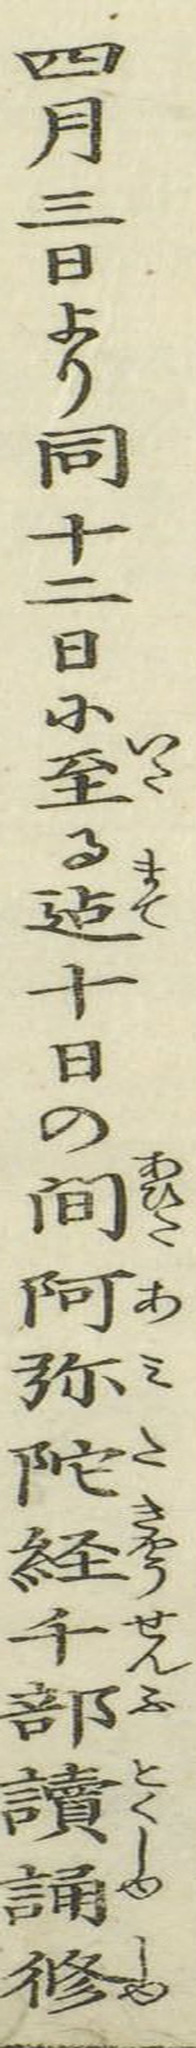四月三日より同十二日に至る迠十日の間阿弥陀経千部讀誦修
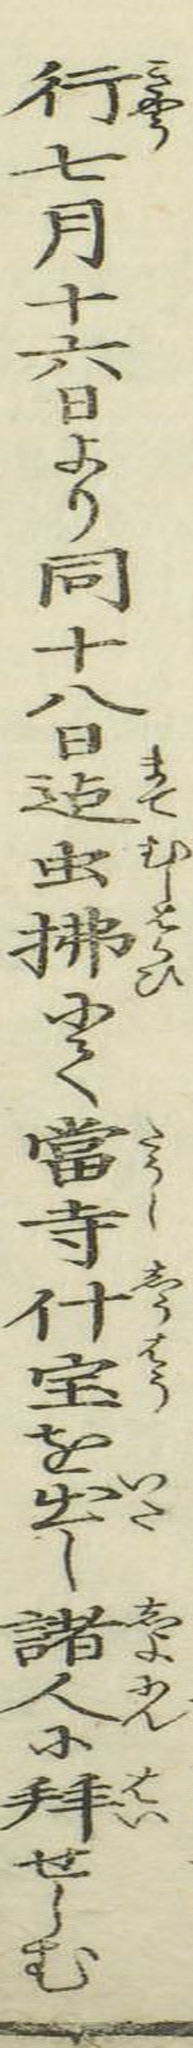行七月十六日より同十八日迠虫拂にて當寺什宝を出し諸人に拜せしむ
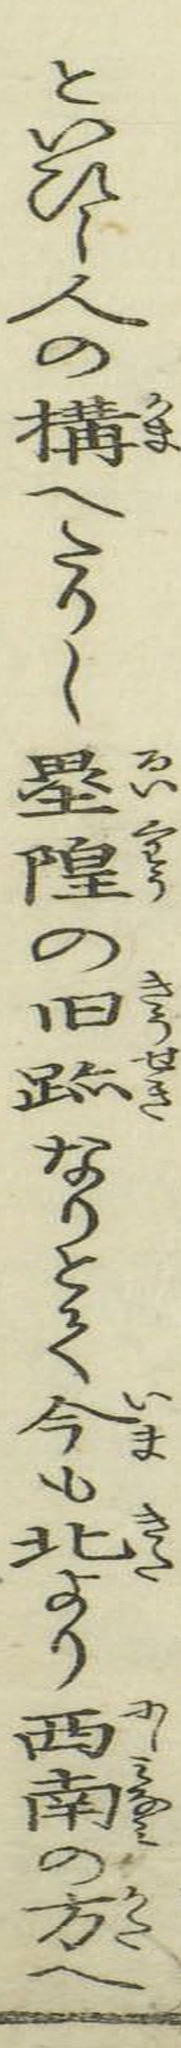といひし人の搆へたりし塁隍の旧跡なりとて今も北より西南の方へ

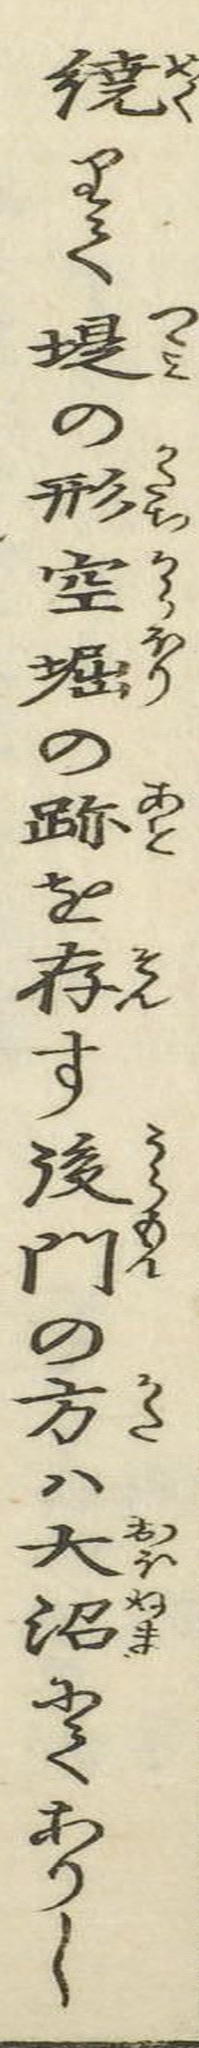繞りて堤の形空堀の跡を存す後門の方は大沼にてありし
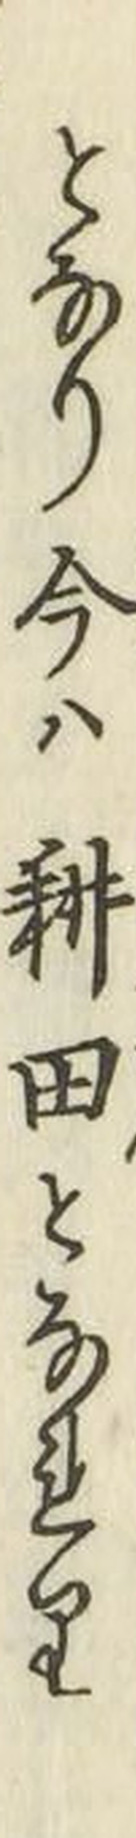となり今は耕田となれり
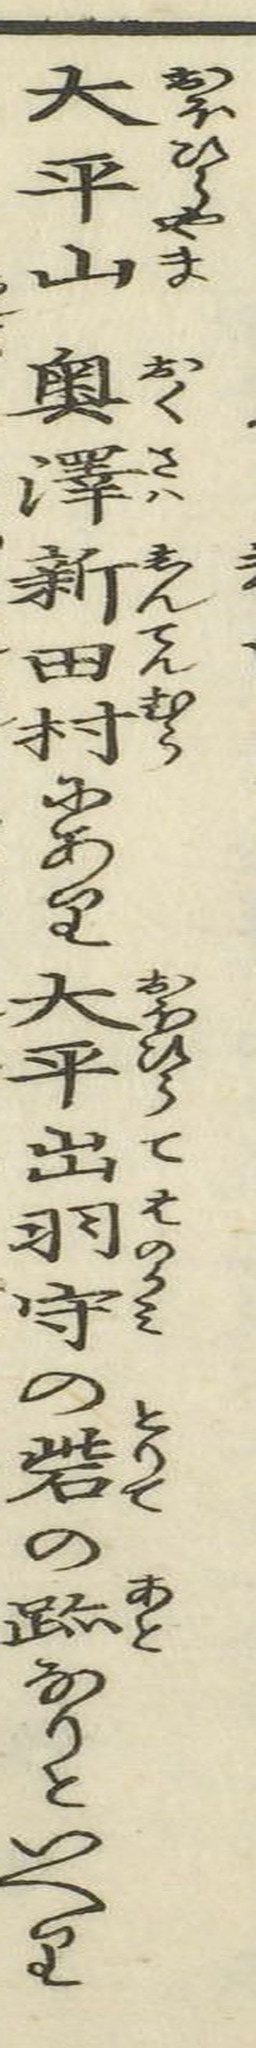大平山奥澤新田村にあり大平出羽守の砦の跡なりといへり
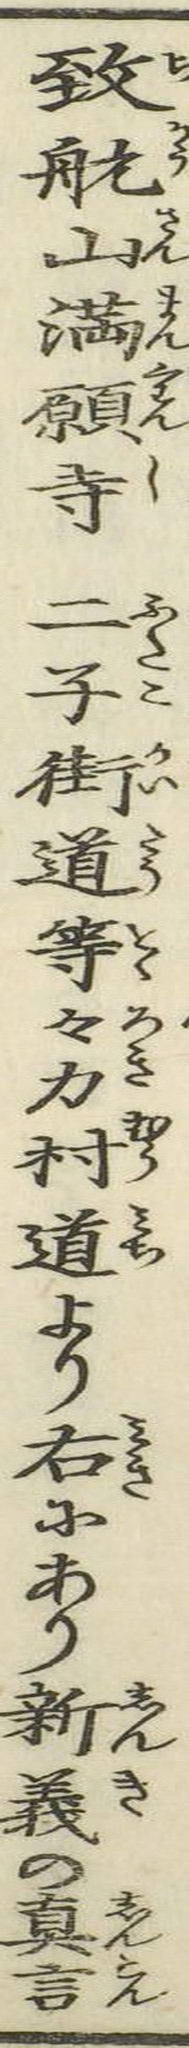致航山滿願寺二子街道等々力村道より右にあり新義の真言
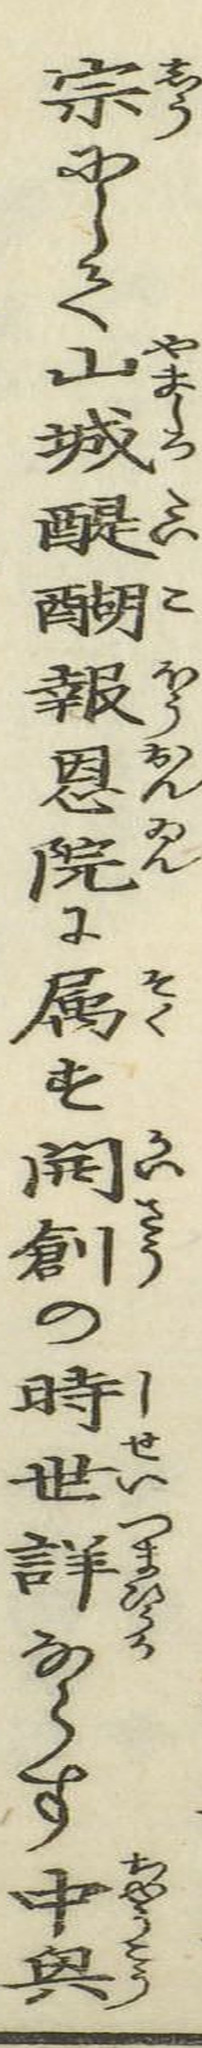宗にして山城醍醐報恩院に属す開創の時世詳ならす中興
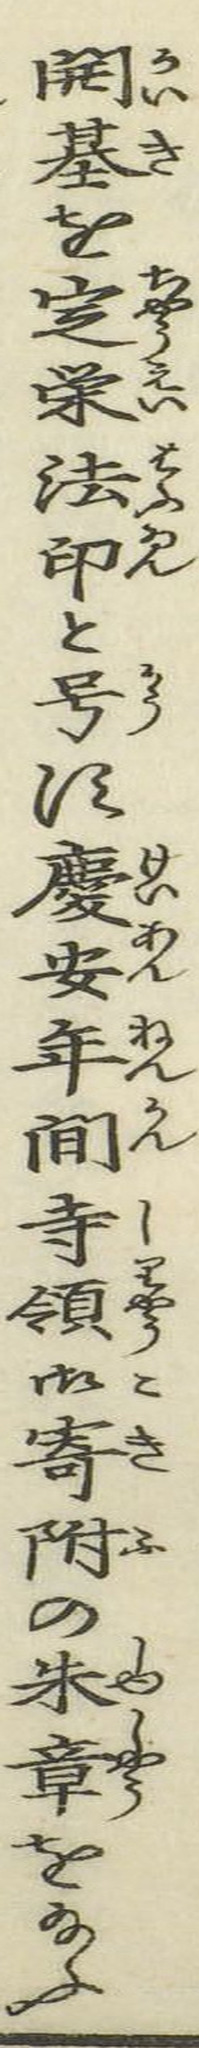開基を定栄法印と号す慶安年間寺領御寄附の朱章を給ふ
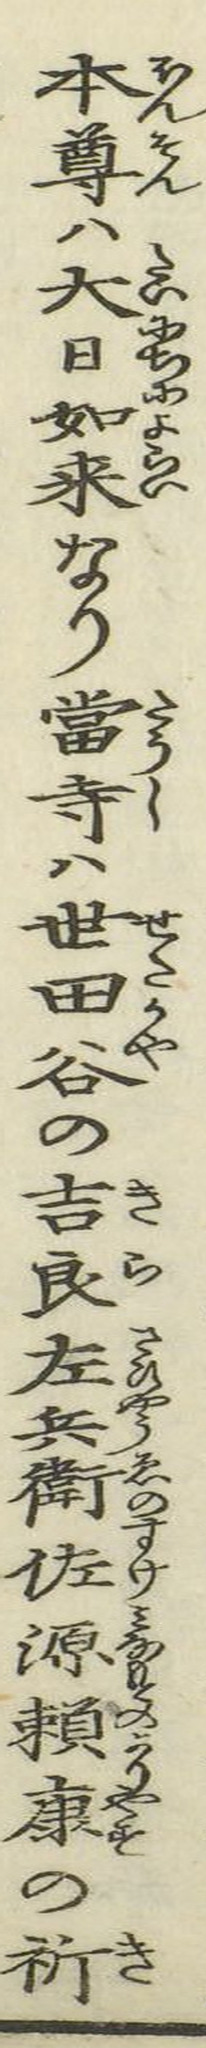本尊は大日如来なり當寺は世田谷の吉良左兵衛佐源頼康の祈
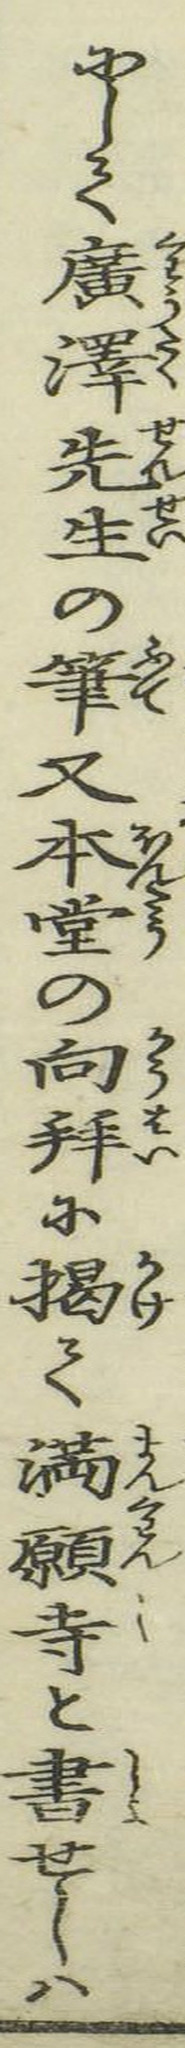にして廣澤先生の筆又本堂の向拜に掲て満願寺と書せしは

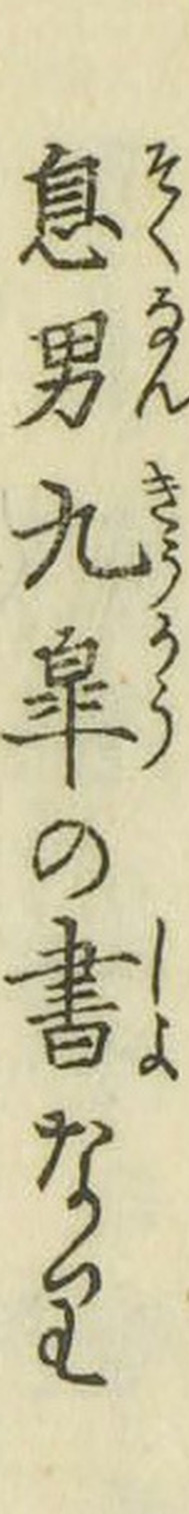息男九皐の書なり
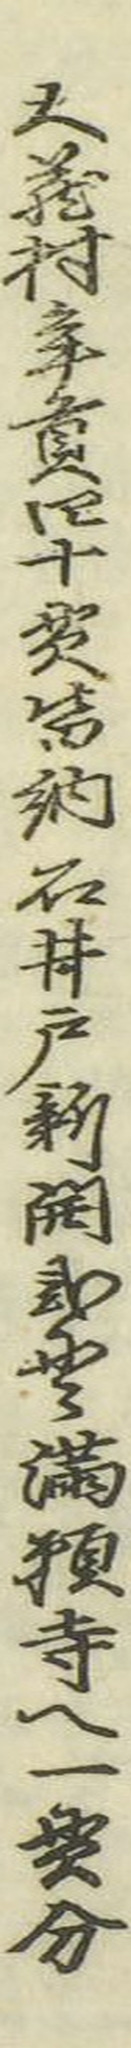大蔵村年貢四十貫皆納石井戸新開弐貫滿願寺へ一貫分
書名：江戸名所図会 20巻 巻之8
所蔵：東京学芸大学教育コンテンツアーカイブ
